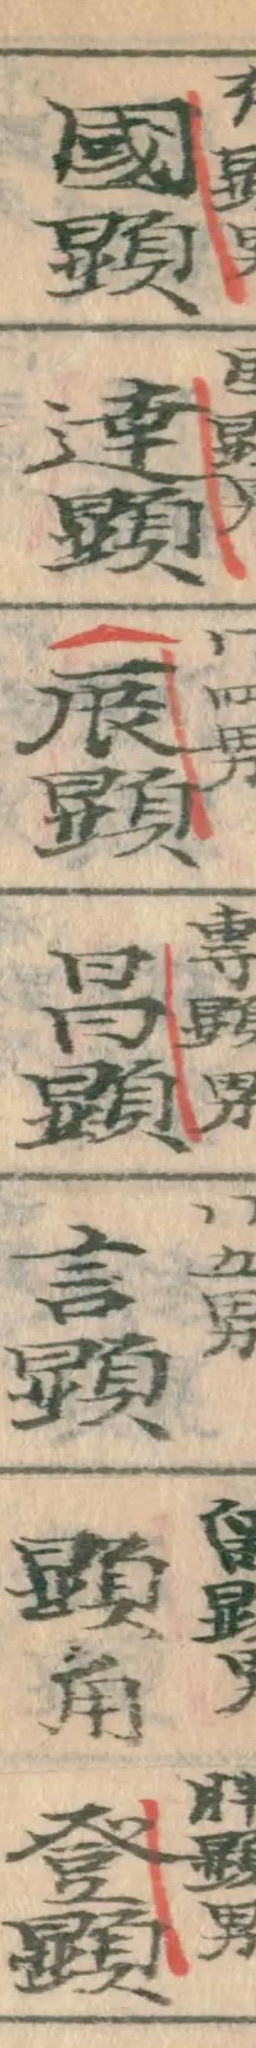国顕達顕▲展顕昌顕言顕顕角登顕
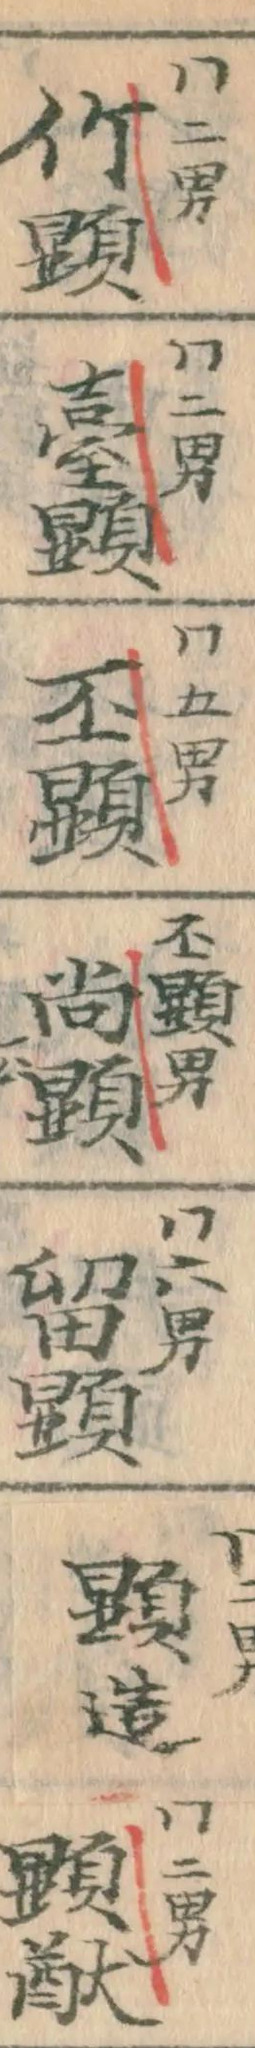竹顕台顕丕顕尚顕留顕顕造顕猷
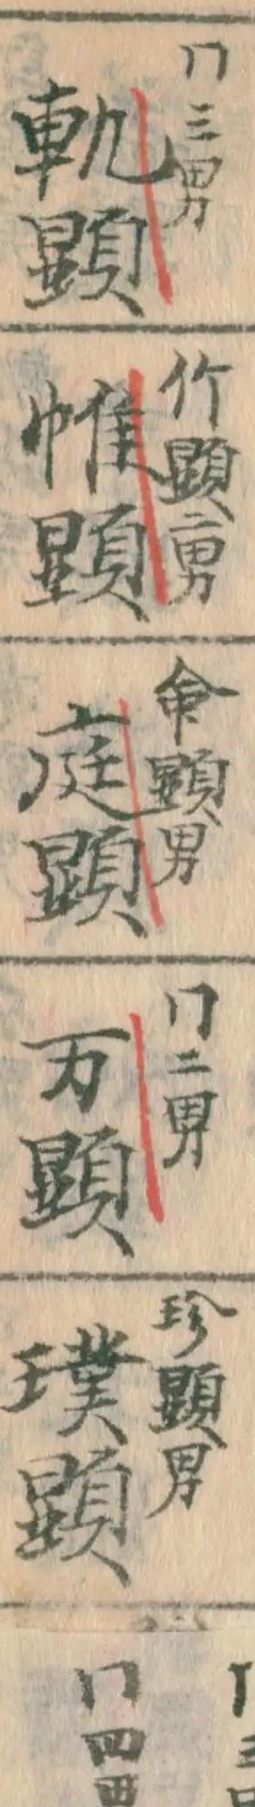軌顕帷顕庭顕万顕璞顕

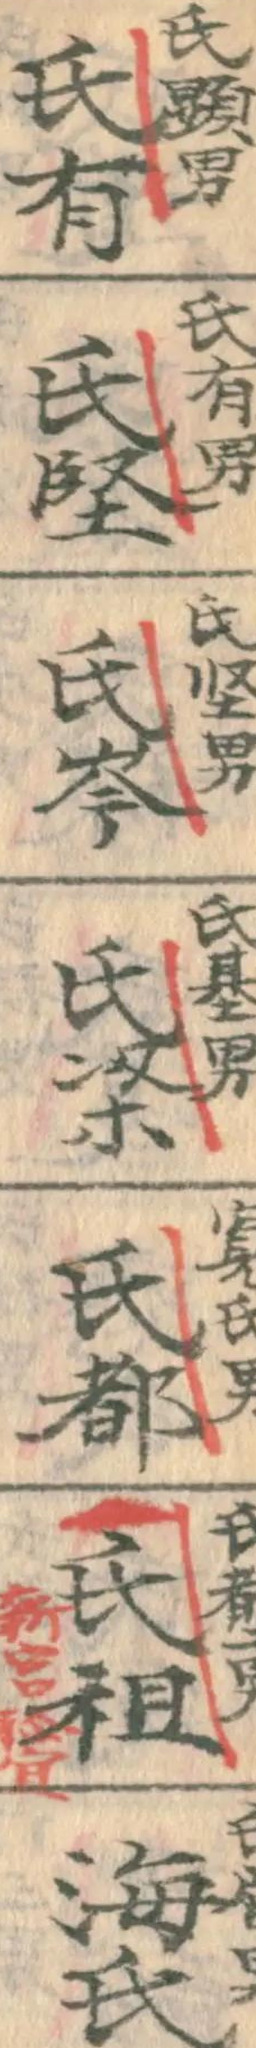氏有氏堅氏岑氏梁氏都▲氏祖海氏
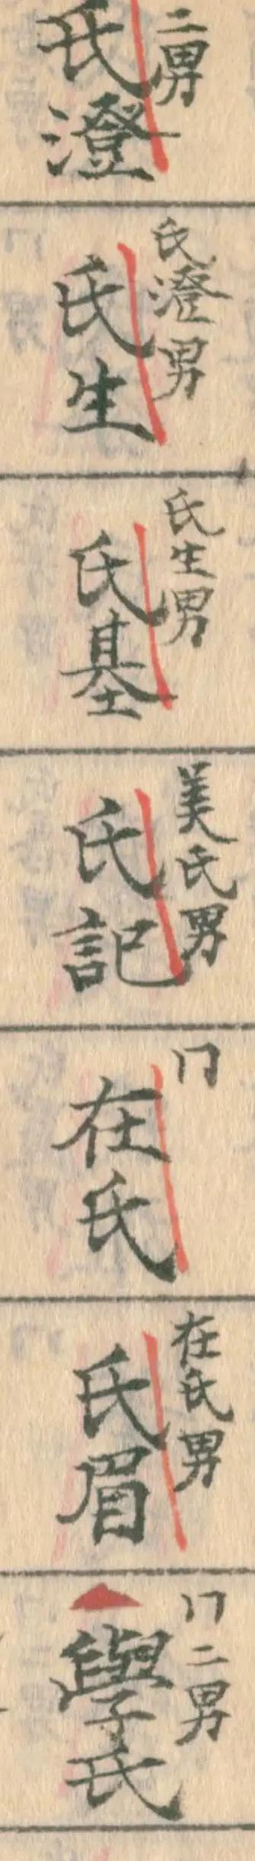氏澄氏生氏基氏記在氏氏眉▲学氏
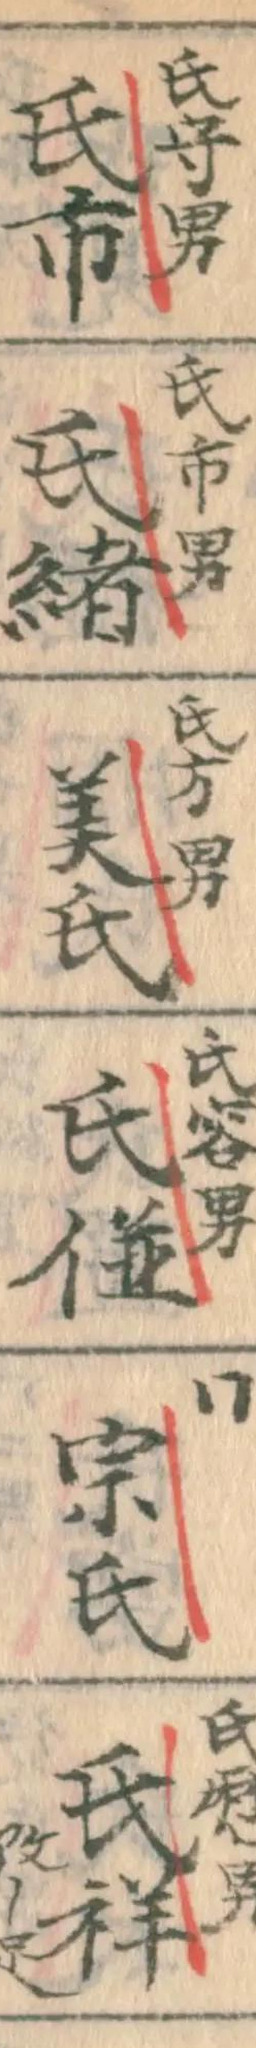氏市氏緒美氏氏宗氏氏祥
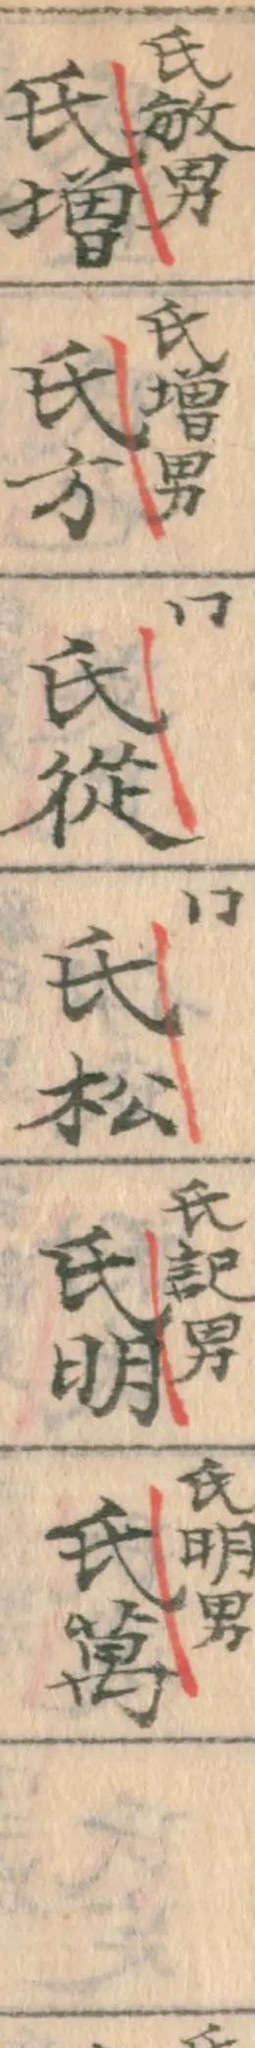氏増氏方氏従氏松氏明氏万氏良
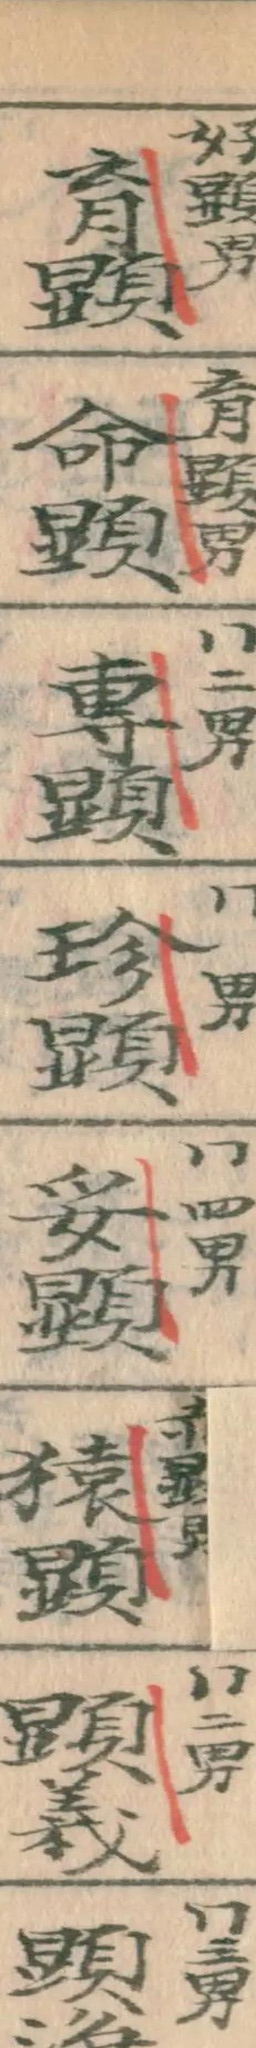育顕命顕専顕珍顕妥顕妥顕顕義顕浄
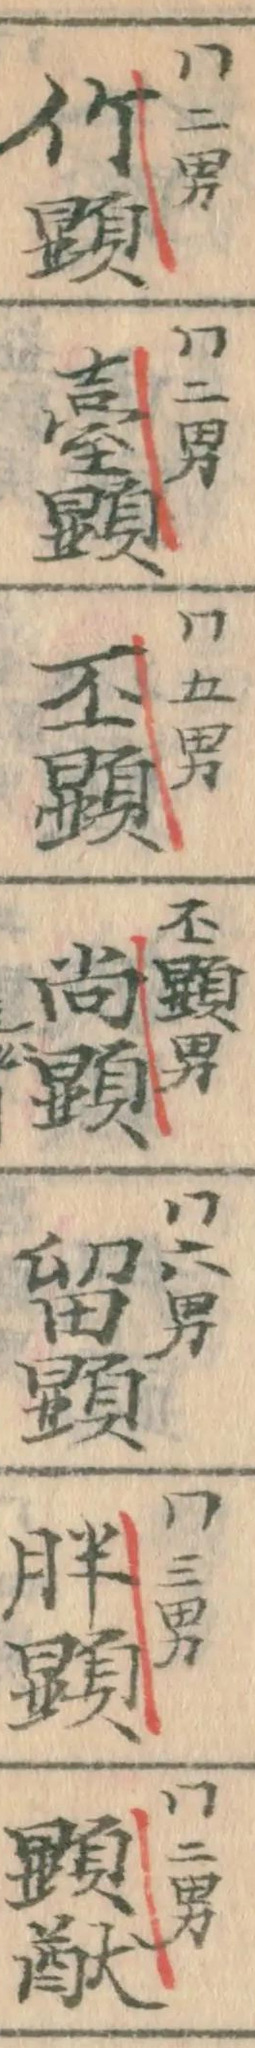竹顕台顕丕顕尚顕留顕胖顕顕猷

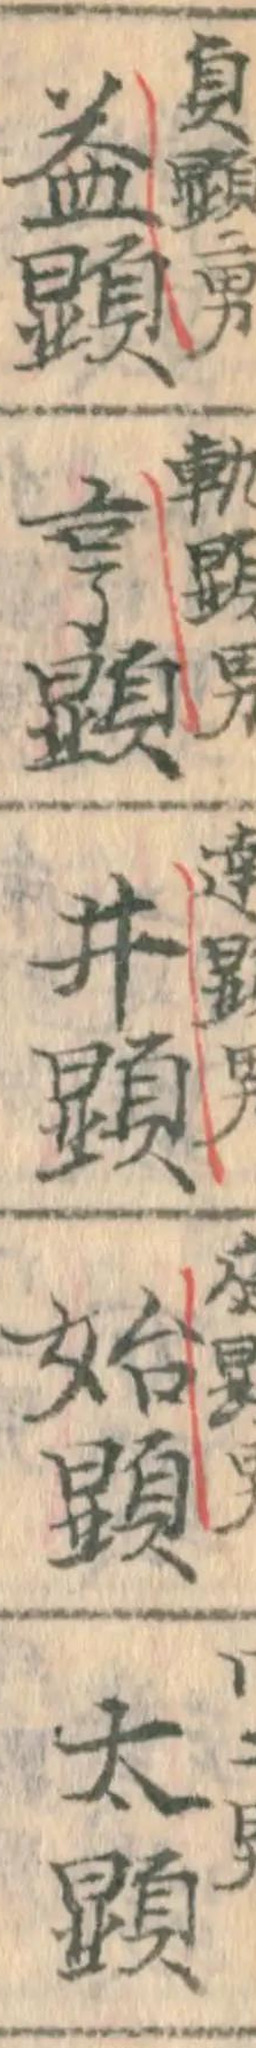益顕亨顕井顕始顕太顕
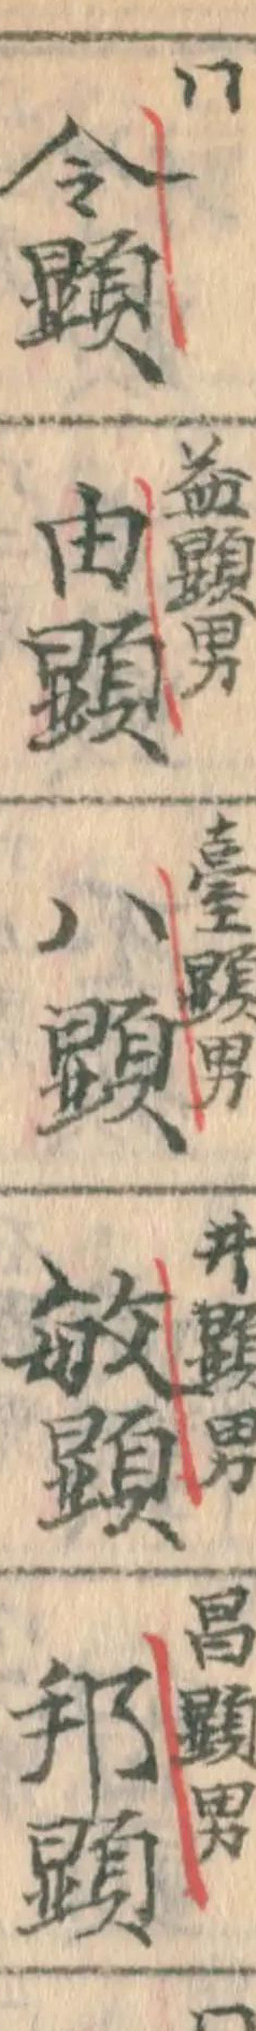令顕由顕八顕敏顕邦顕
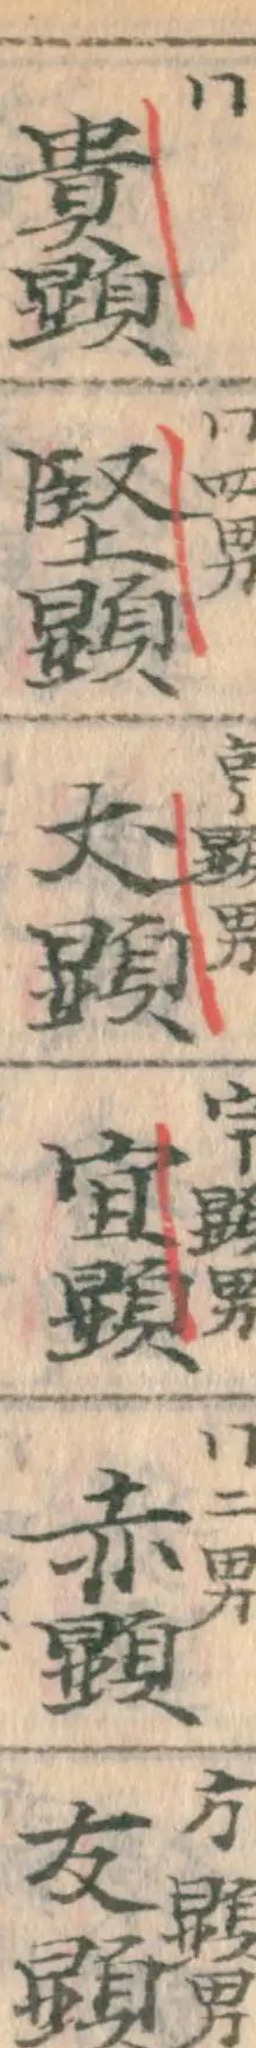貴顕堅顕丈顕宜顕赤顕友顕
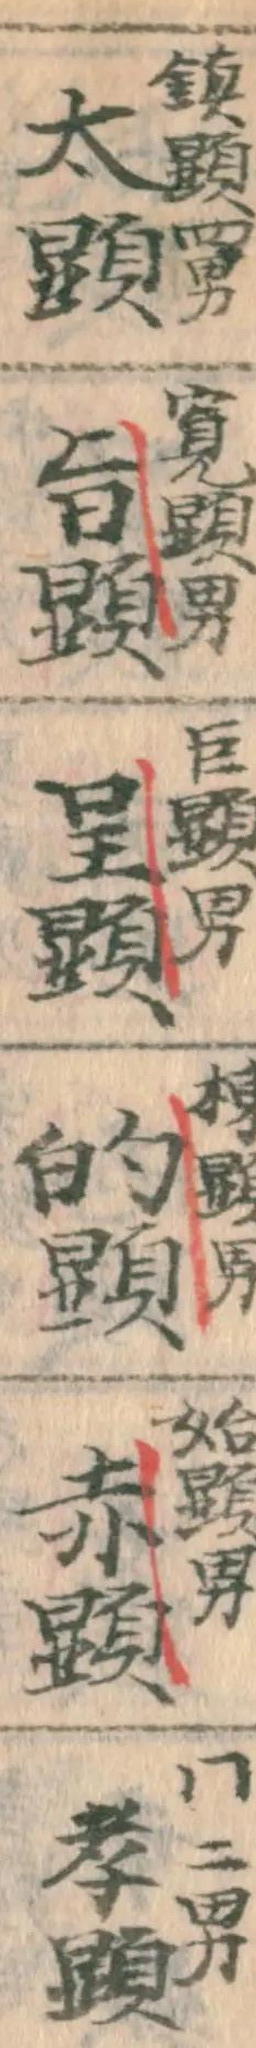太顕旨顕呈顕的顕赤顕孝顕
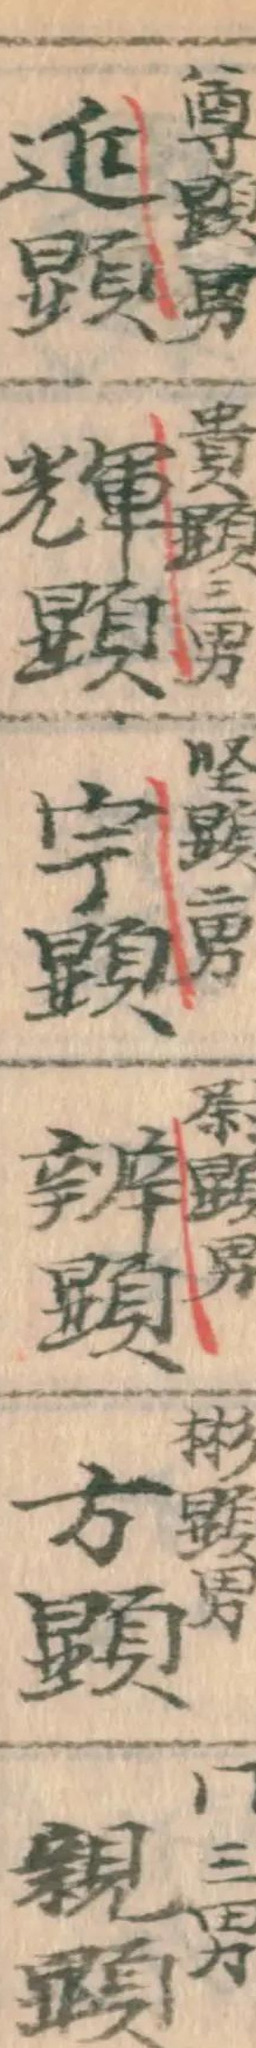近顕輝顕宇顕弁顕方顕親顕
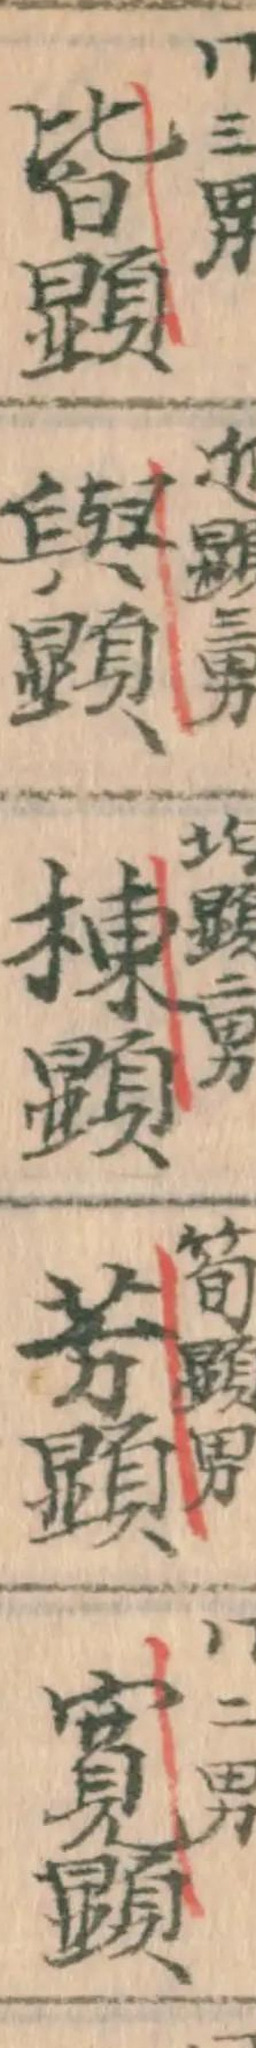皆顕与顕棟顕芳顕寛顕
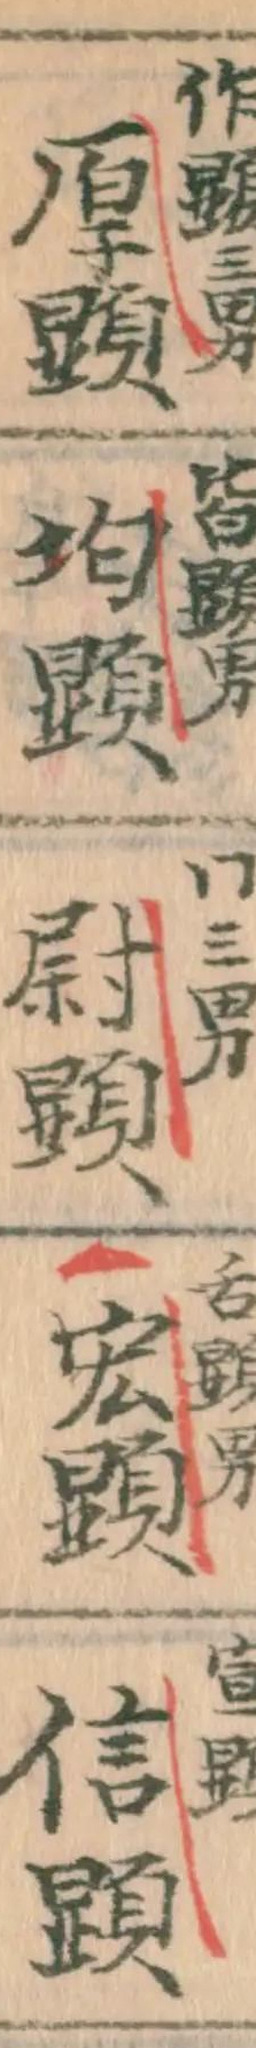厚顕均顕尉顕▲宏顕信顕
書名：賀茂社記録. 第24冊
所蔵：国立国会図書館 National Diet Library, JAPAN
